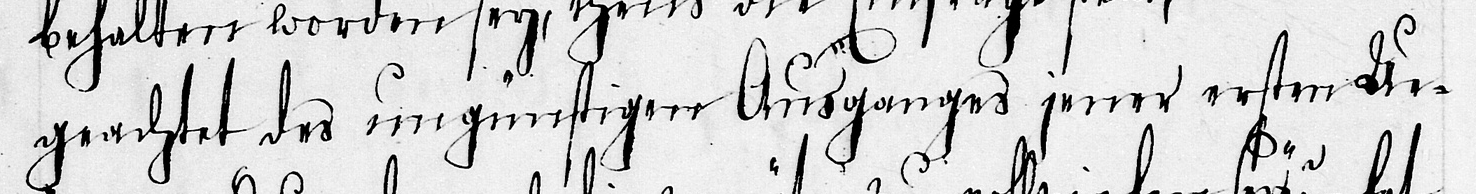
geachtet des ungünstigen Ausganges jener ersten Ue¬
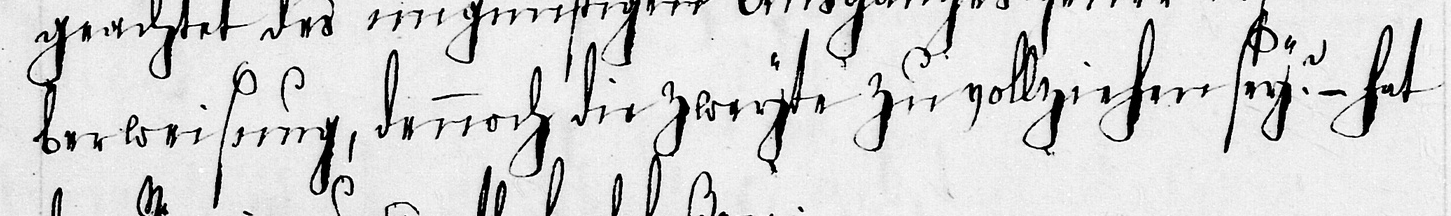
berweisung, dennoch die zweyte zu vollziehen sey? – h¬
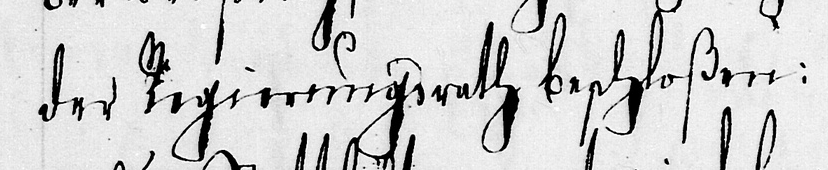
der Regierungsrath beschloßen:
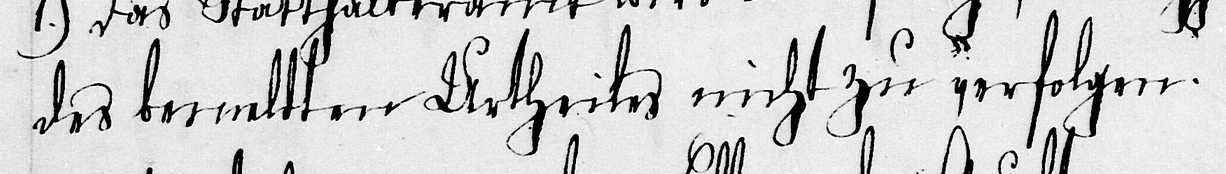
des bemeldten Urtheiles nicht zu verfolgen.
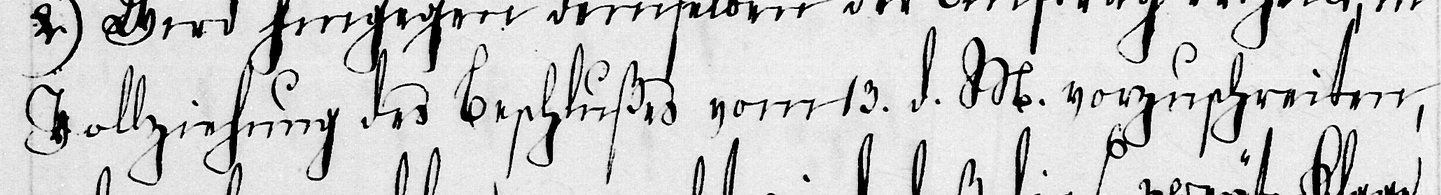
Vollziehung des Beschlußes vom 13. d. M. vorzuschreiten,
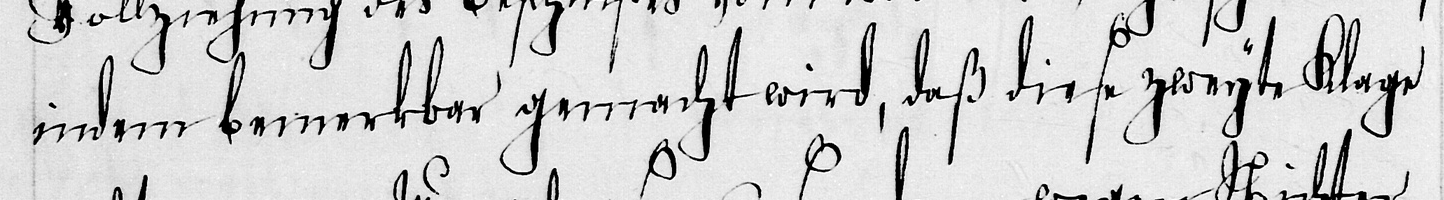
indem bemerkbar gemacht wird, daß diese zweyte Klage
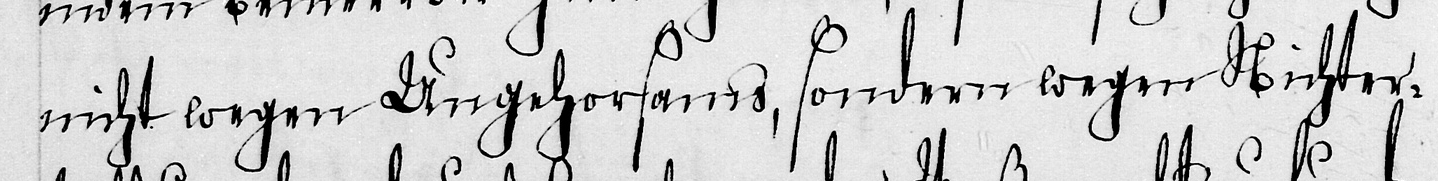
nicht wegen Ungehorsams, sondern wegen Nichter¬
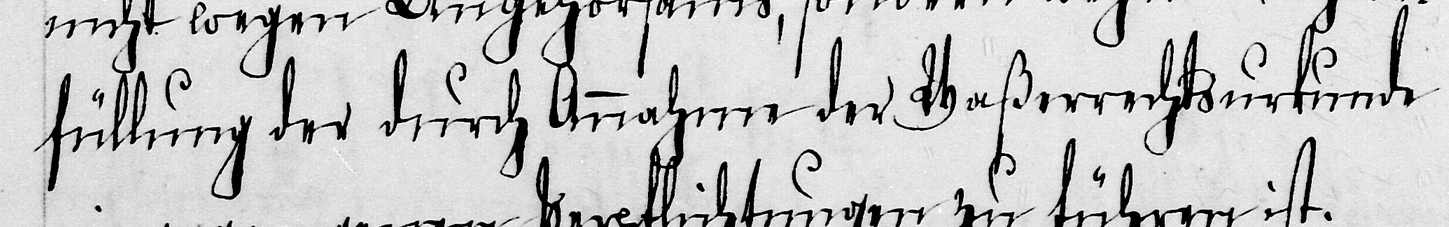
füllung der durch Annahme der Waßerrechtsurkunde
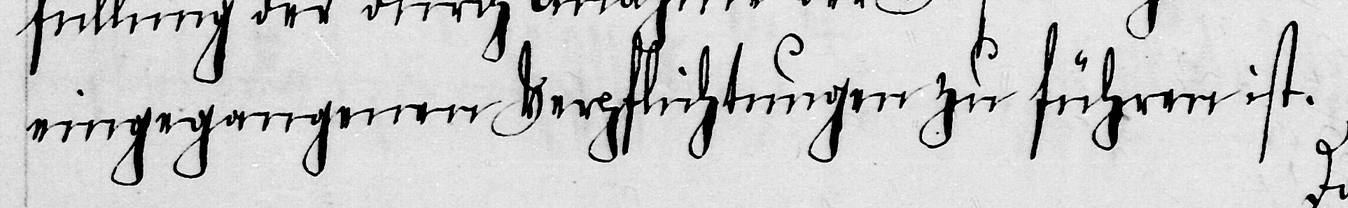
eingegangenen Verpflichtungen zu führen ist.
